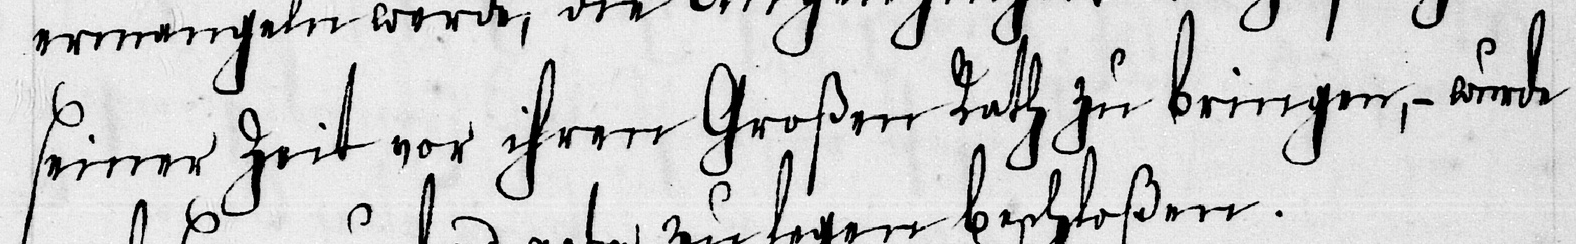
seiner Zeit vor ihren Großen Rath zu bringen, – wurde
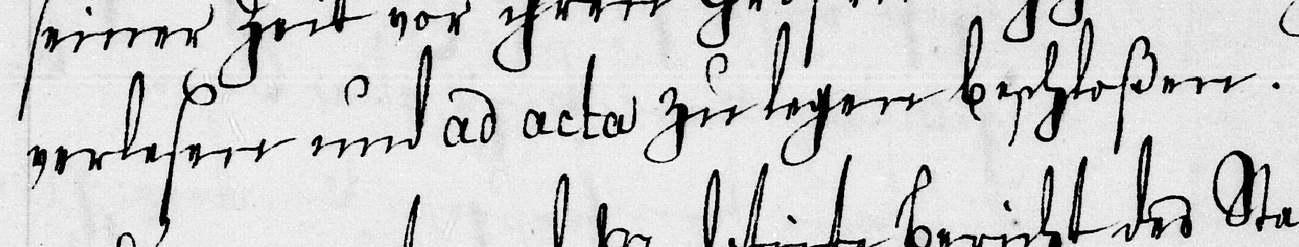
verlesen und ad acta zu legen beschloßen.
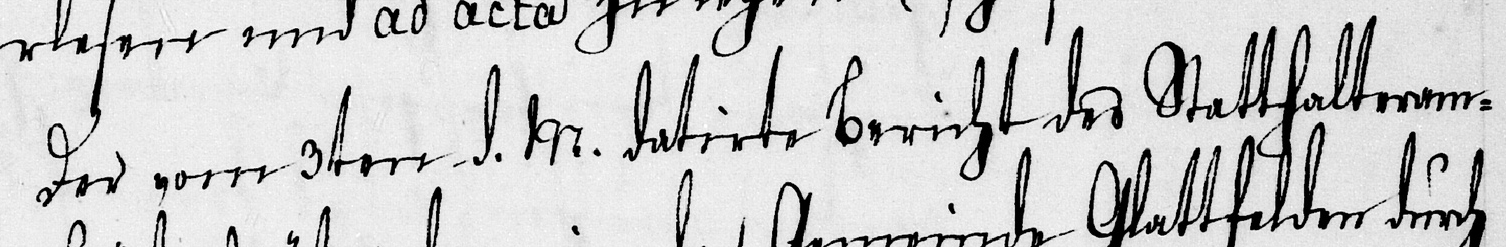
Der vom 3ten d. M. datirte Bericht des Statthalteram¬
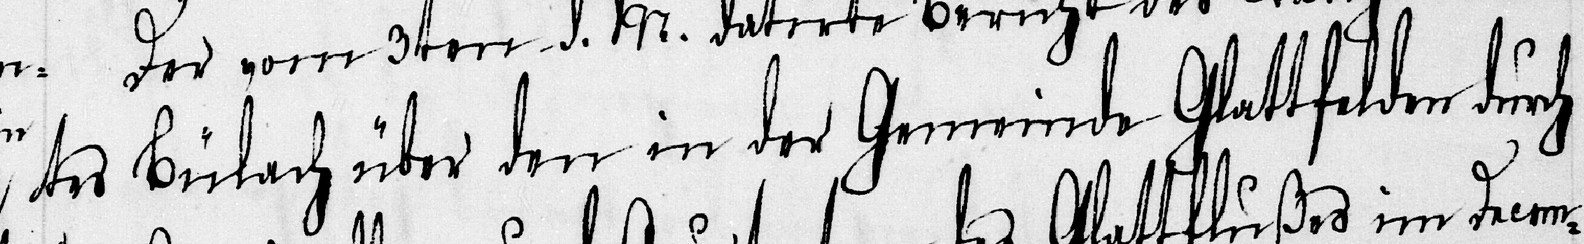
tes Bülach über den in der Gemeinde Glattfelden du¬
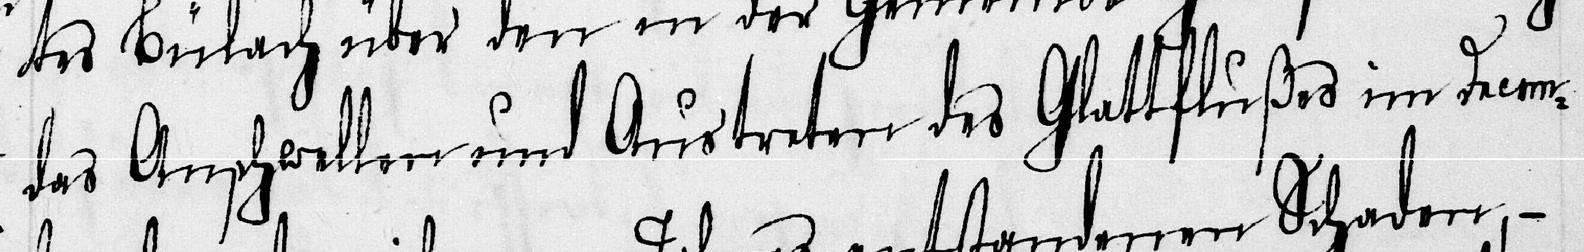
das Anschwellen und Austreten des Glattflußes im Decem¬
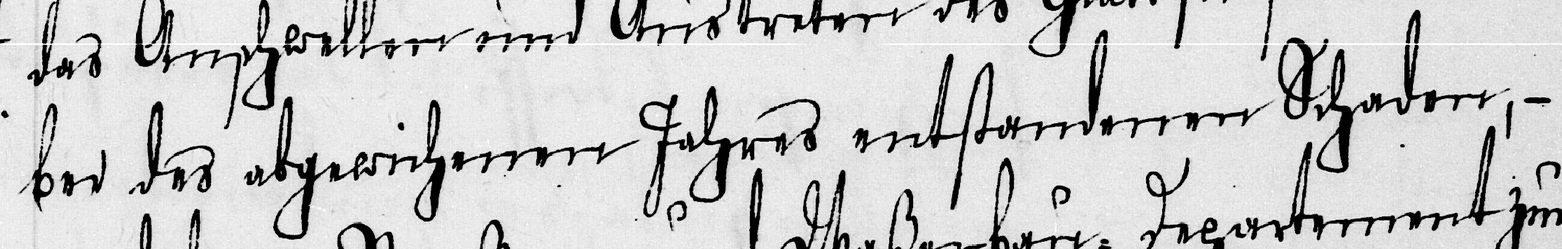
ber des abgewichenen Jahres entstandenen Schaden,
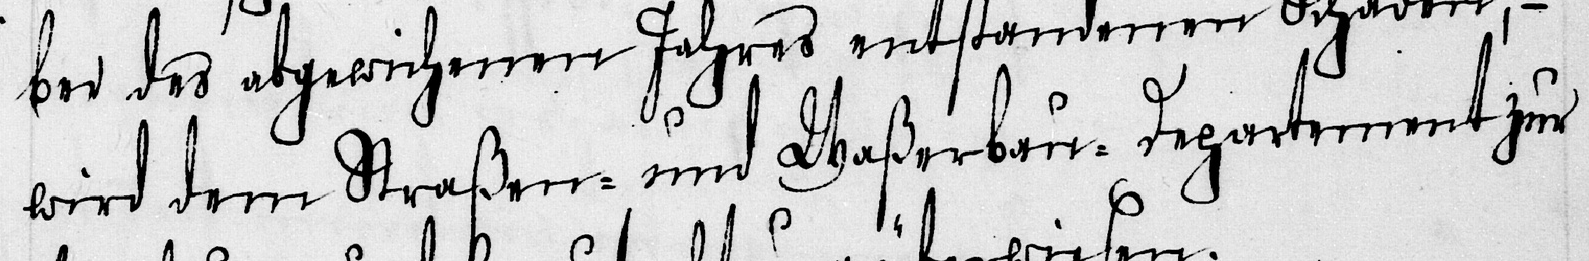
wird dem Straßen- und Waßerbau-Departement zur
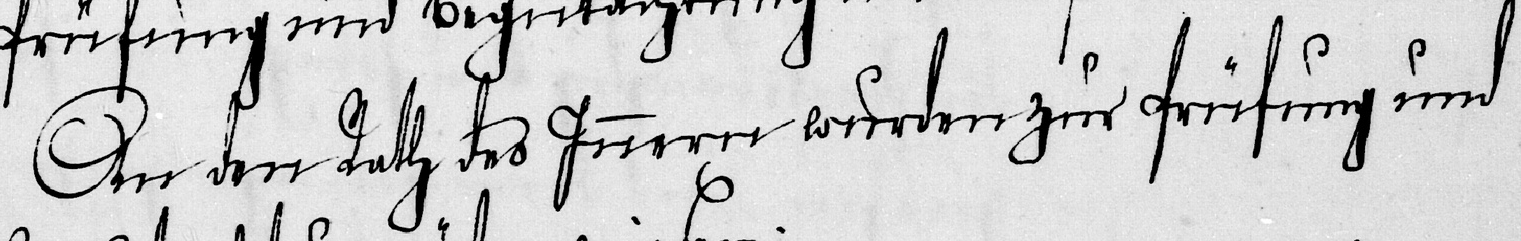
An den Rath des Innern wurden zu Prüfung und
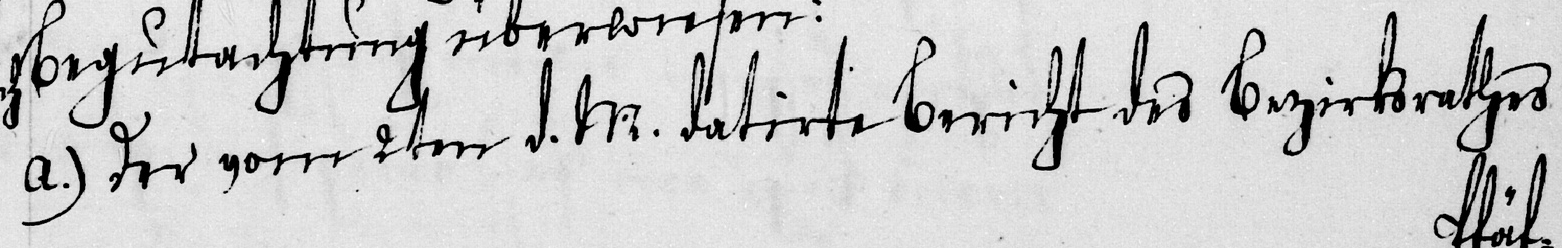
a.) Der vom 2ten d. M. datirte Bericht des Bezirksrathes
